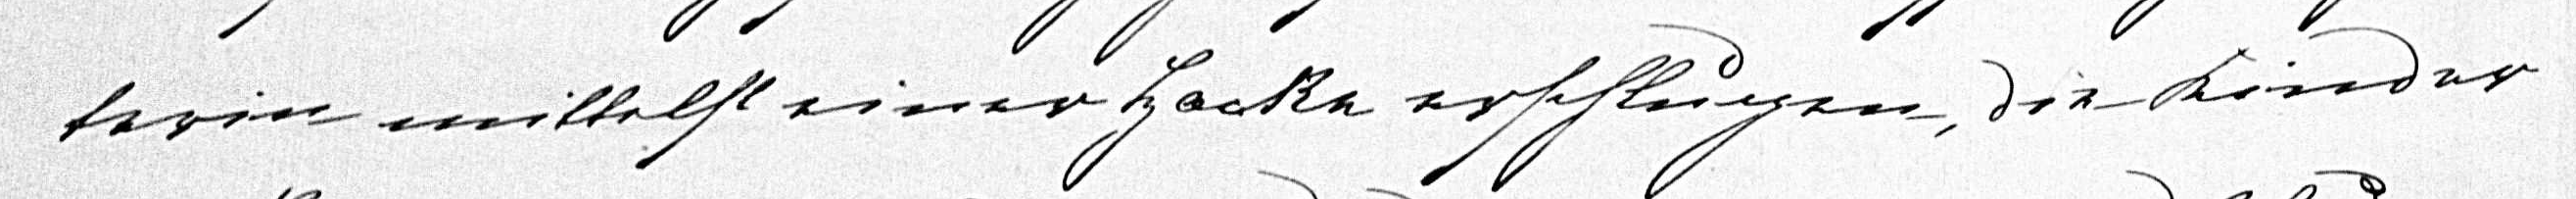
terin mittelst einer Hacke erschlugen, die Kinder
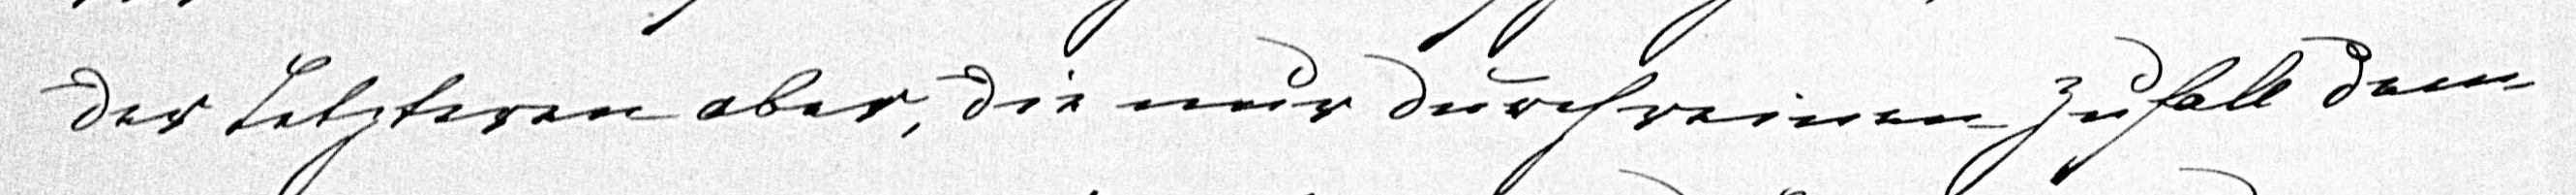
der Letzteren aber, die nur durch reinen Zufall dem
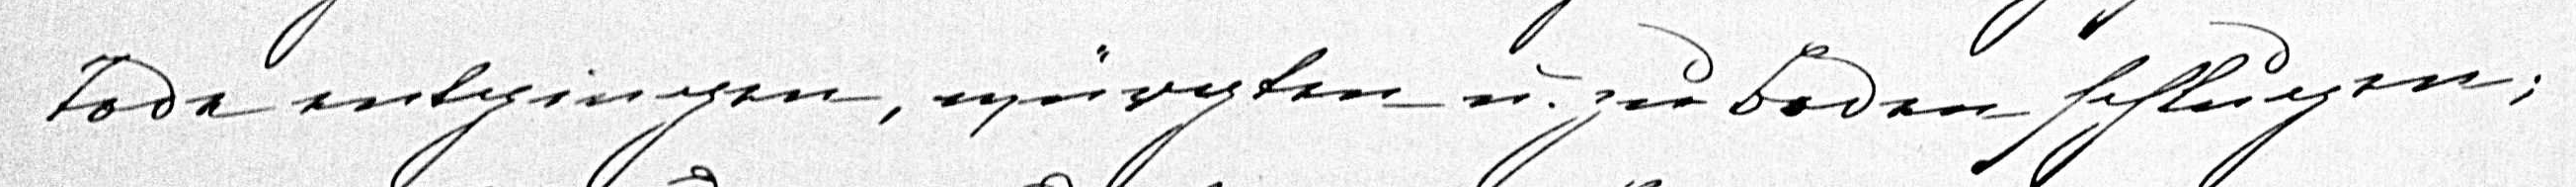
Tode entgingen, würgten u. zu Boden schlugen;
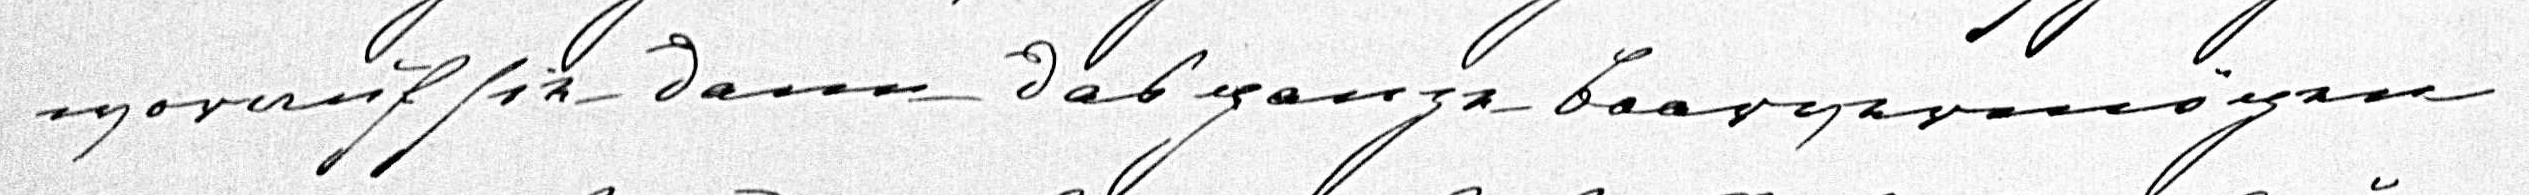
worauf sie dann das ganze Baarvermögen
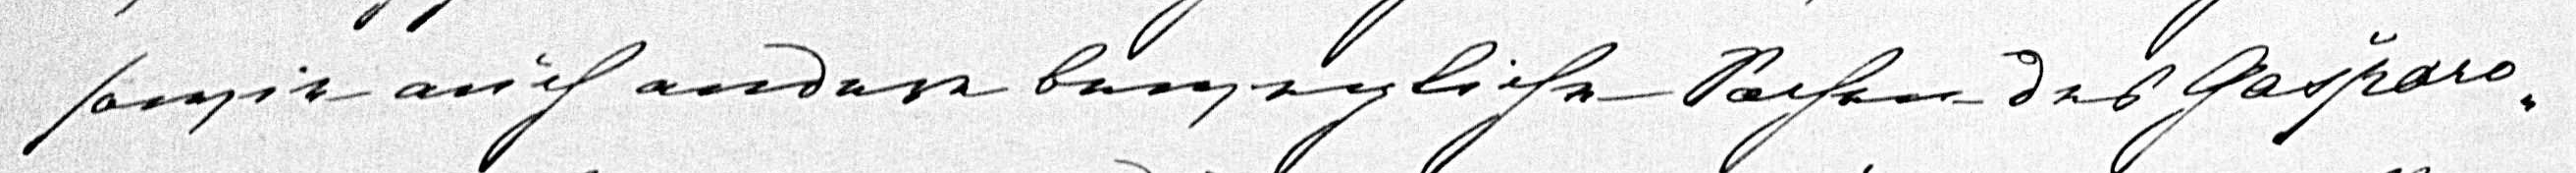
sowie auch andere beweglich Sachen des Gašparo¬
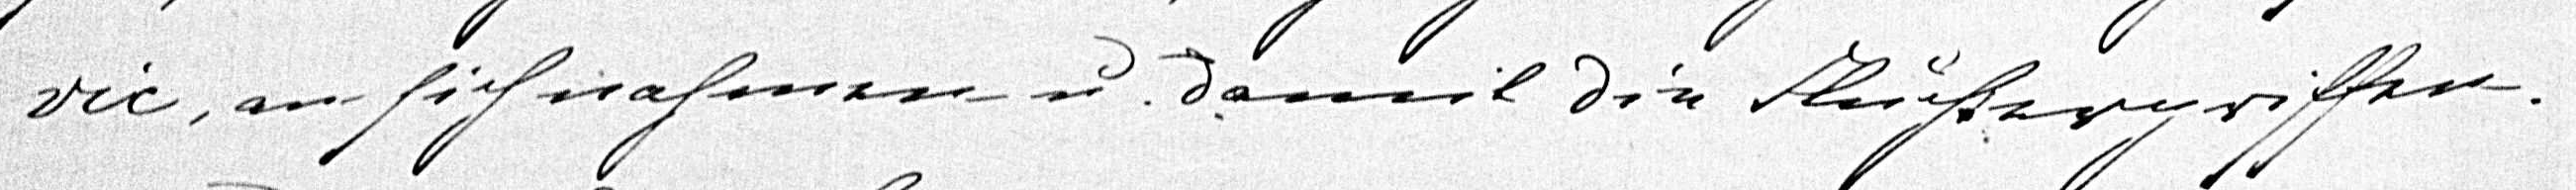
vić, an sich nahmen u damit die Flucht ergriffen.
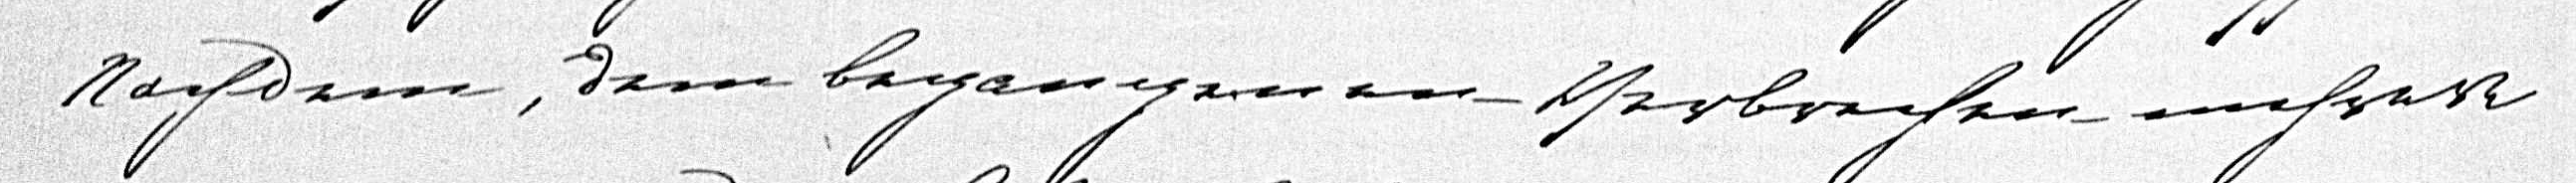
Nachdem, dem begangenen Verbrechen mehrere
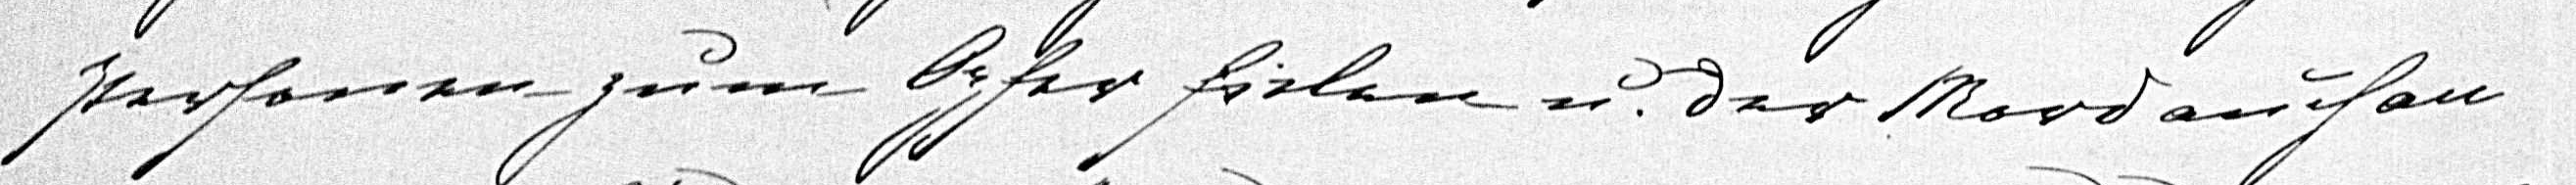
Personen zum Opfer fielen u. der Mord auch an
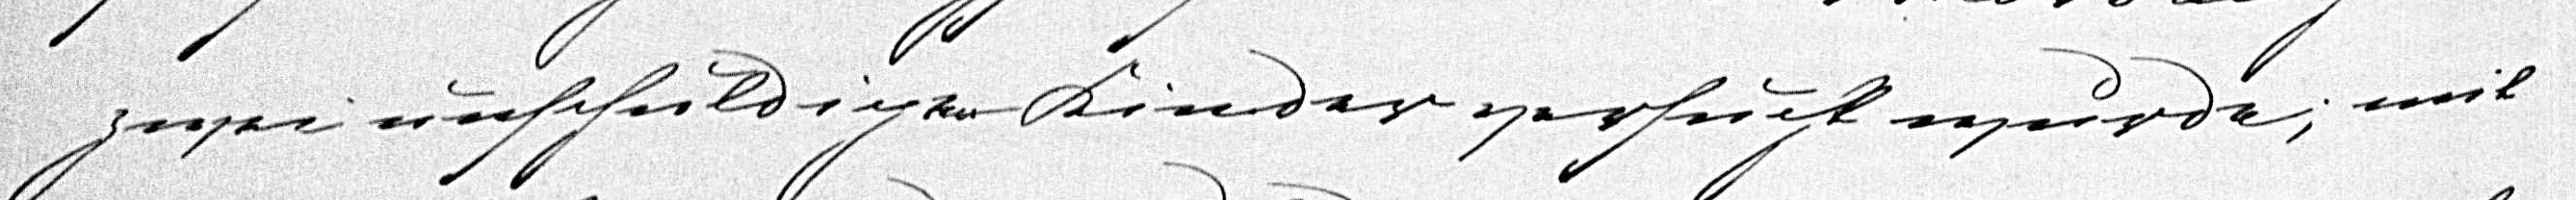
zwei unschuldigen Kinder versucht wurde; mit
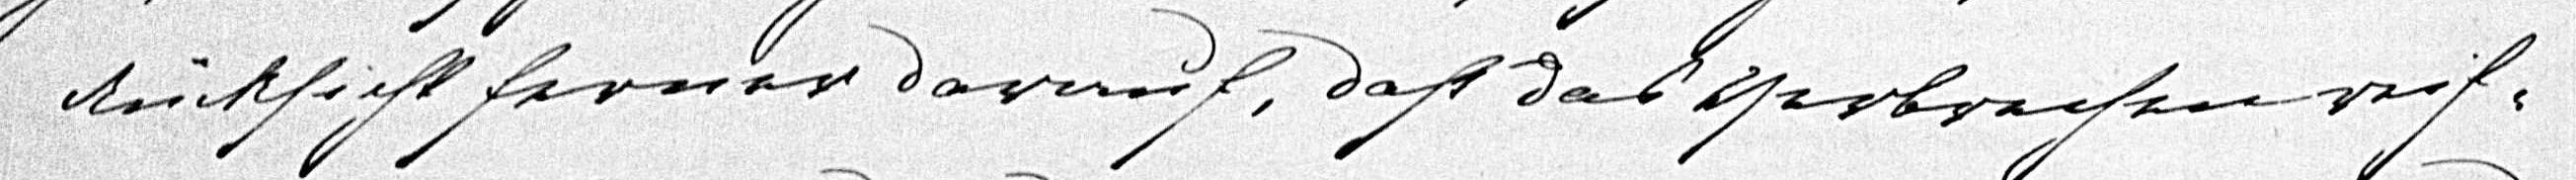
Rücksicht ferner darauf, daß das Verbrechen reif¬
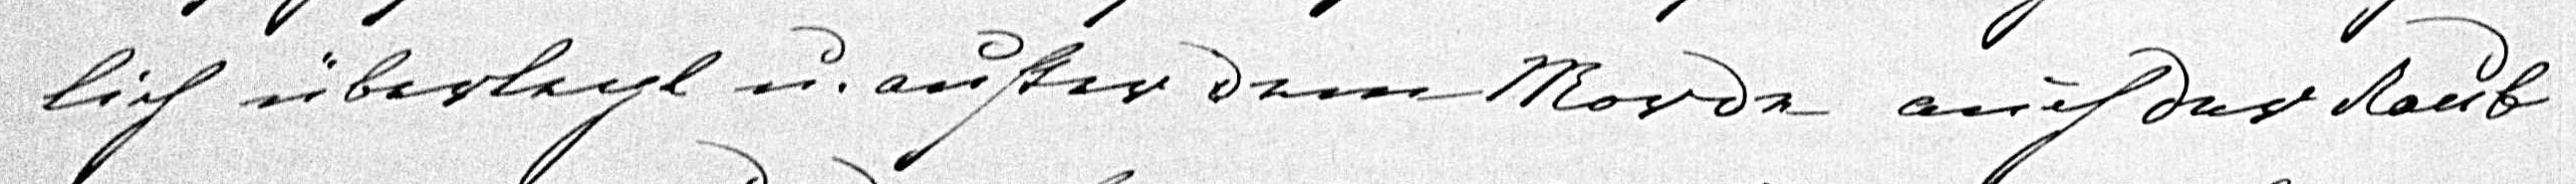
lich überlegt u. außer dem Morde auch der Raub
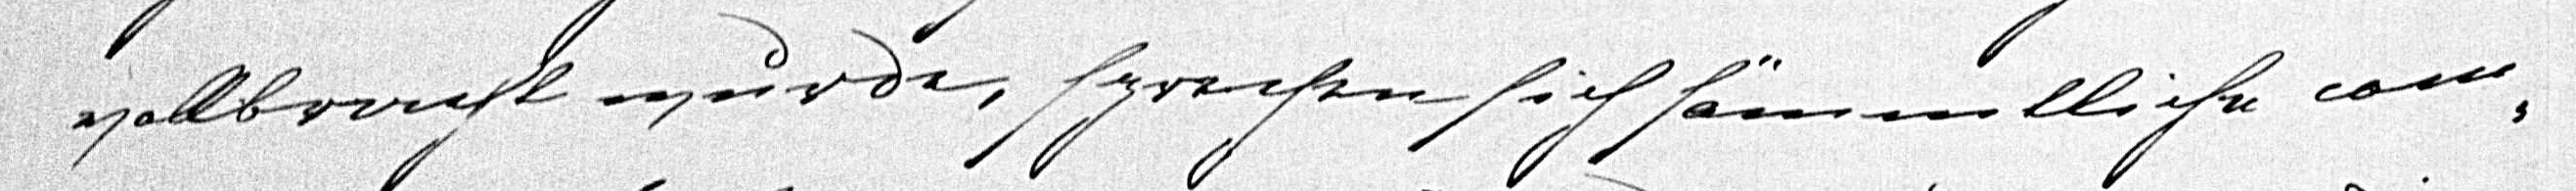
vollbracht wurde, sprechen sich sämmtliche com¬
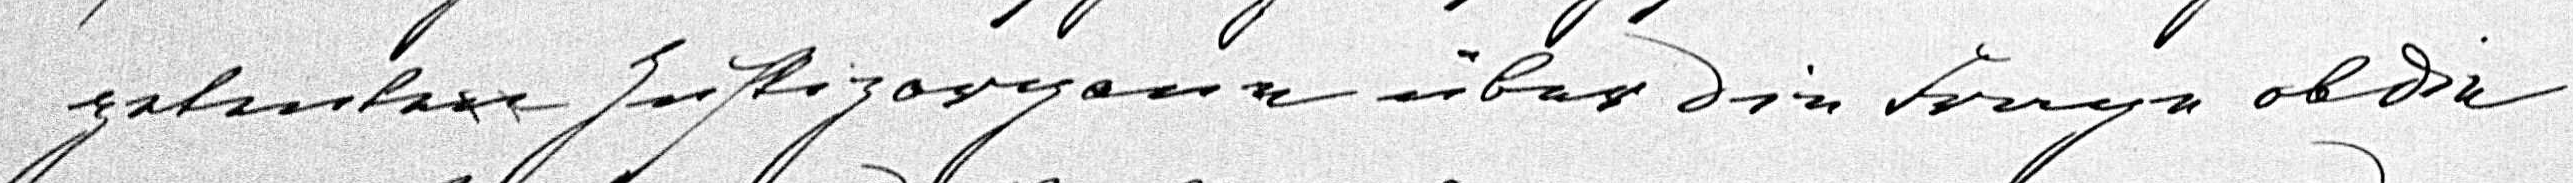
petente Justizorgane über die Frage ob die
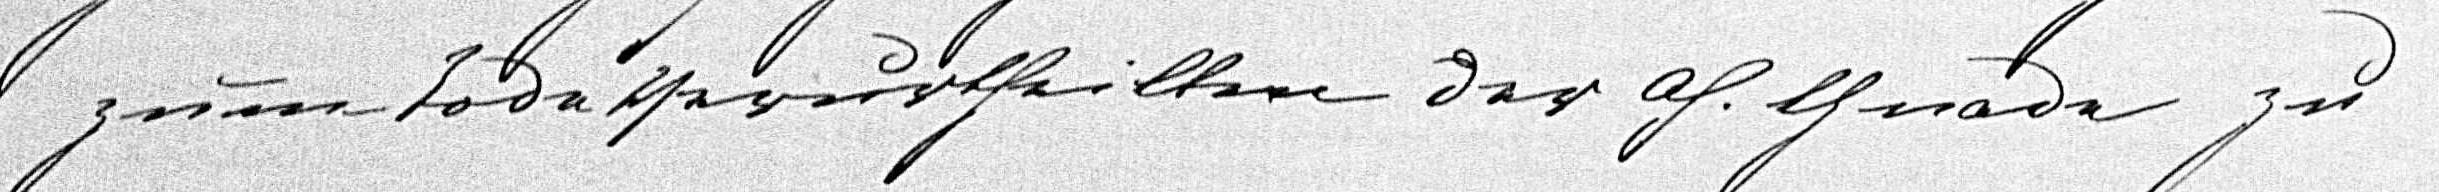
zum Todesverurtheilten der Ah. Gnade zu
